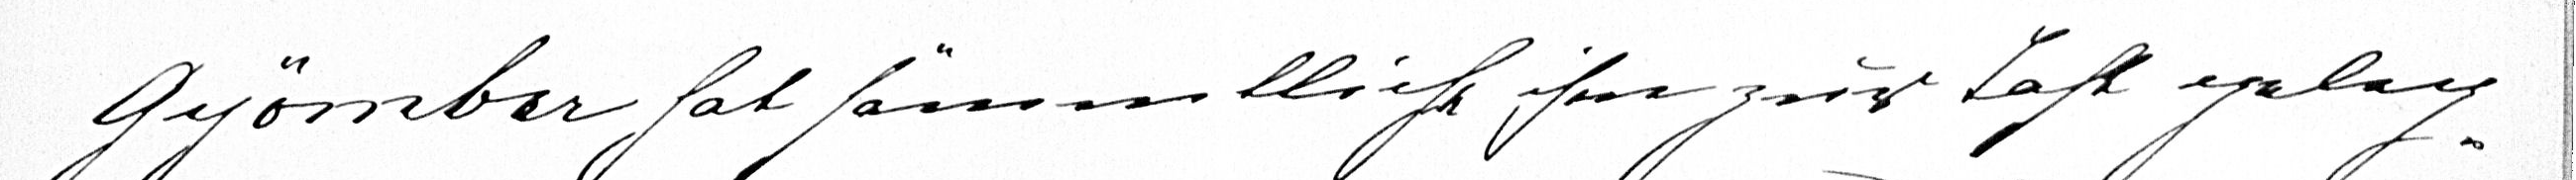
Gyömber hat sämmtliche ihm zur Last geleg¬
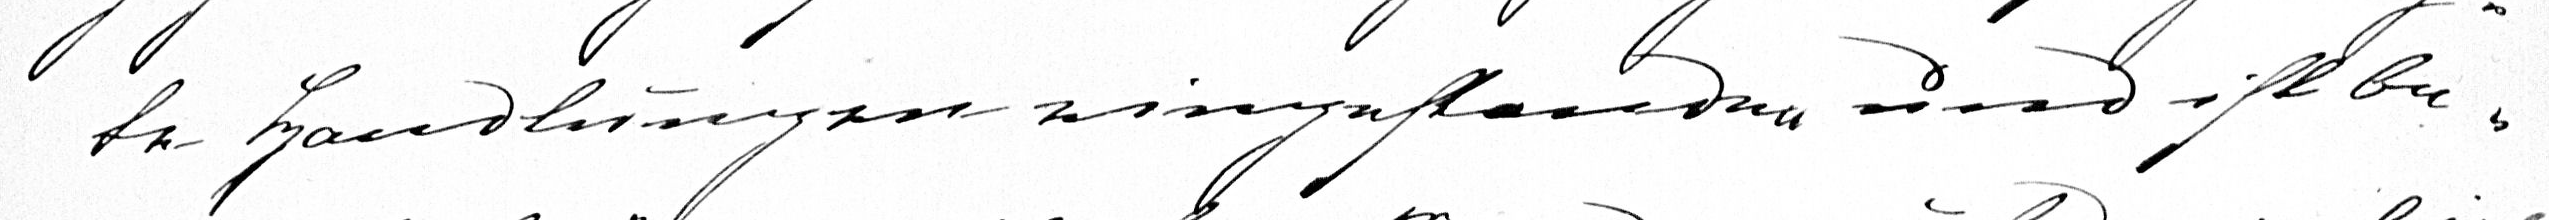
te Handlungen eingestanden und ist be¬
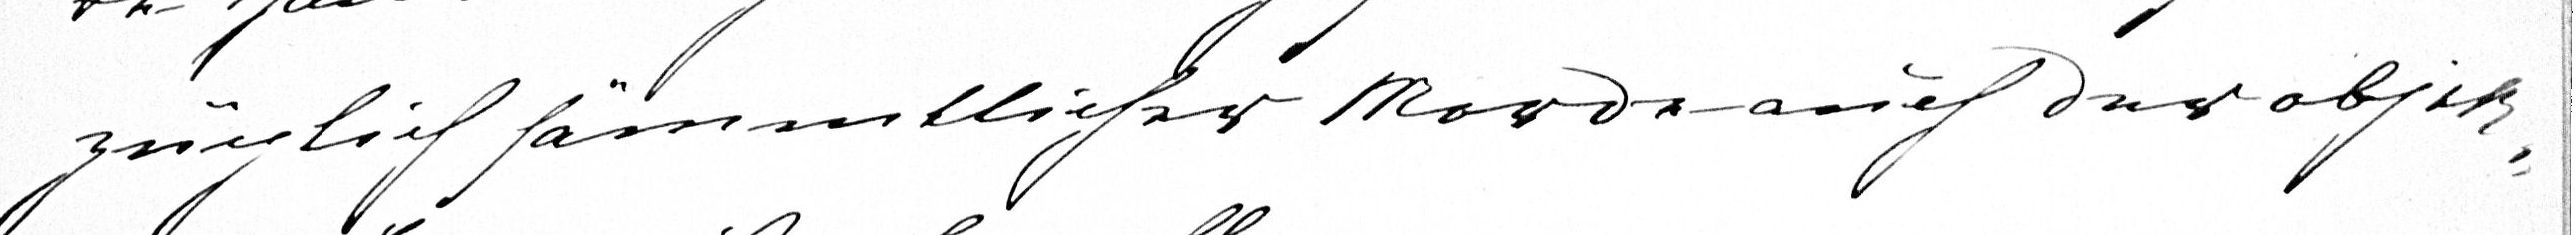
züglich sämmtlicher Morde auch der objek¬
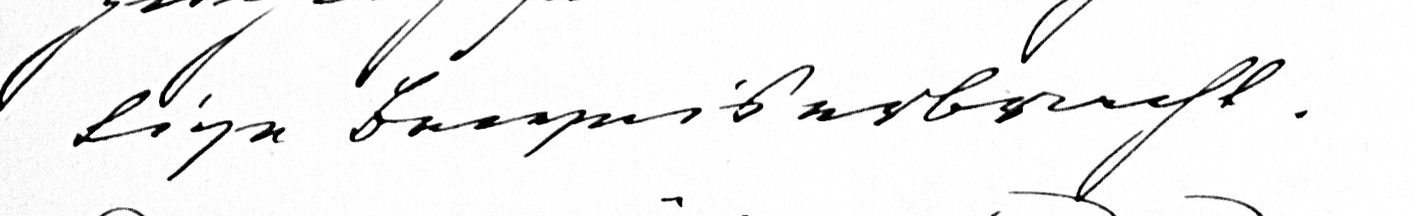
tive beweiserbrecht.
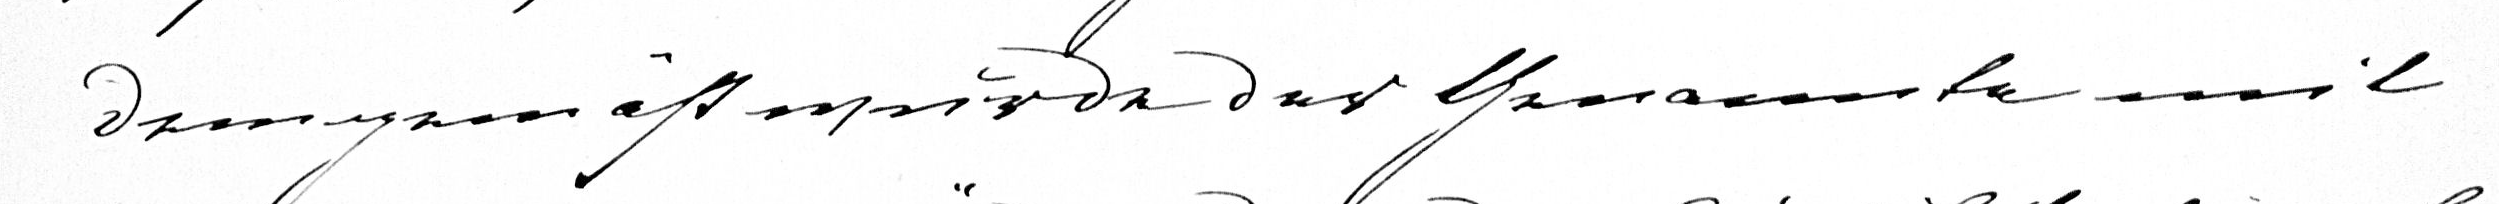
Dem gemäß wurde der Genannte mit
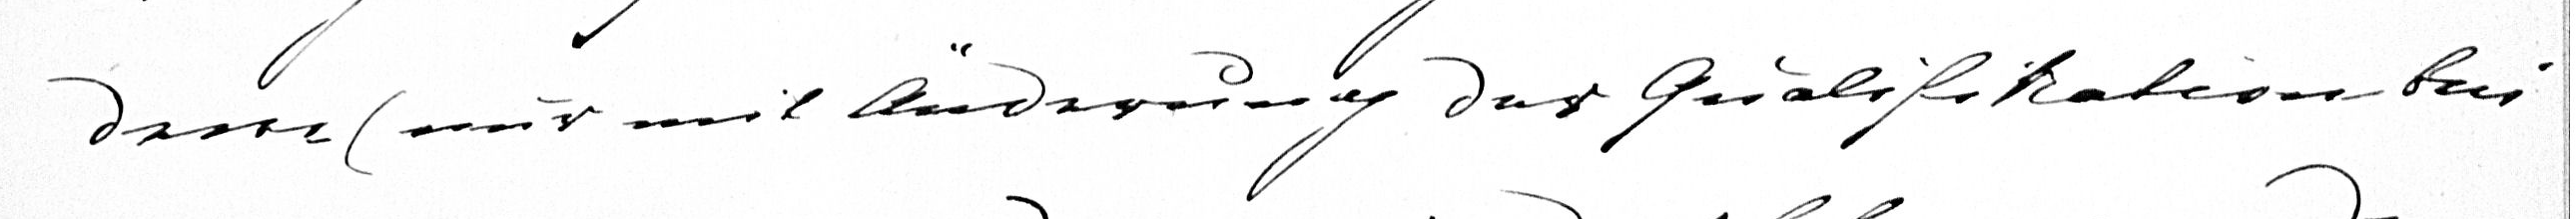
dem (nur mit Änderung der Qualifikation bei
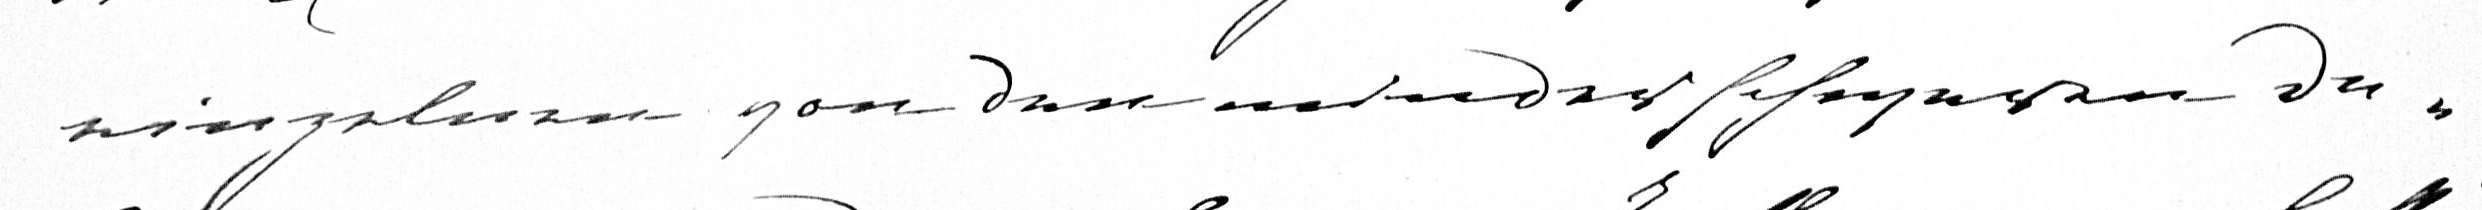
einzelnen von den minder schweren de¬
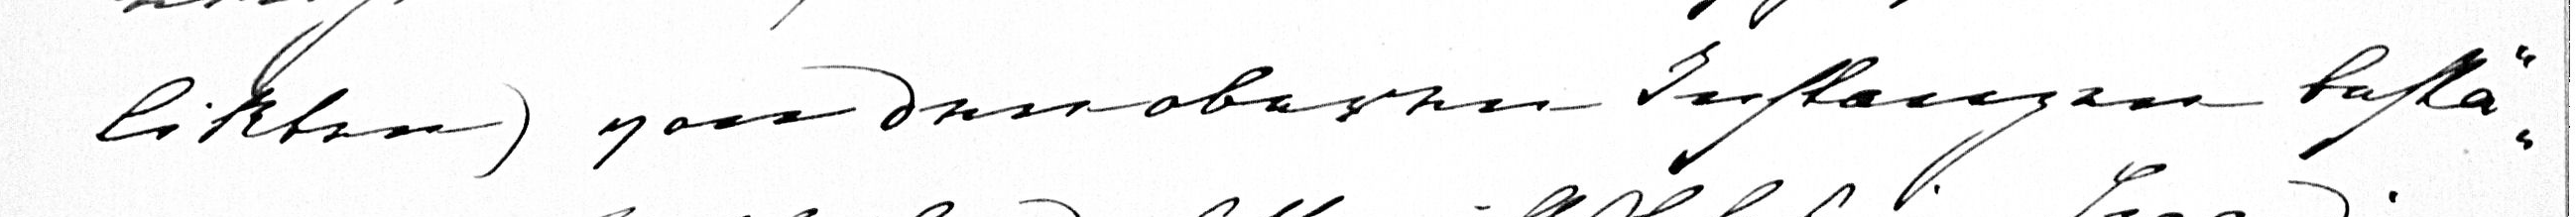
likten) von den oberen Instanzen bestä¬
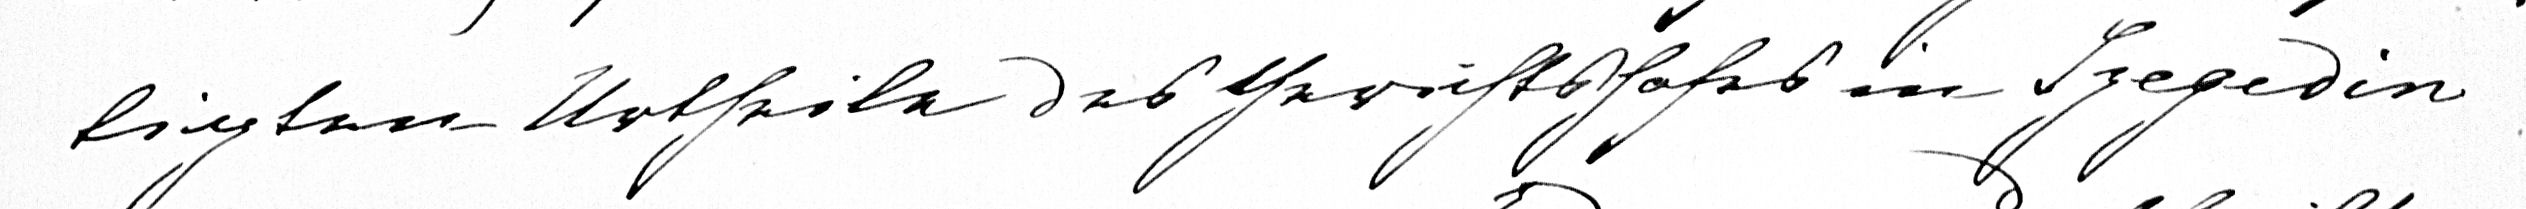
tigten Urtheile des Gerichtshofes in Szegedin
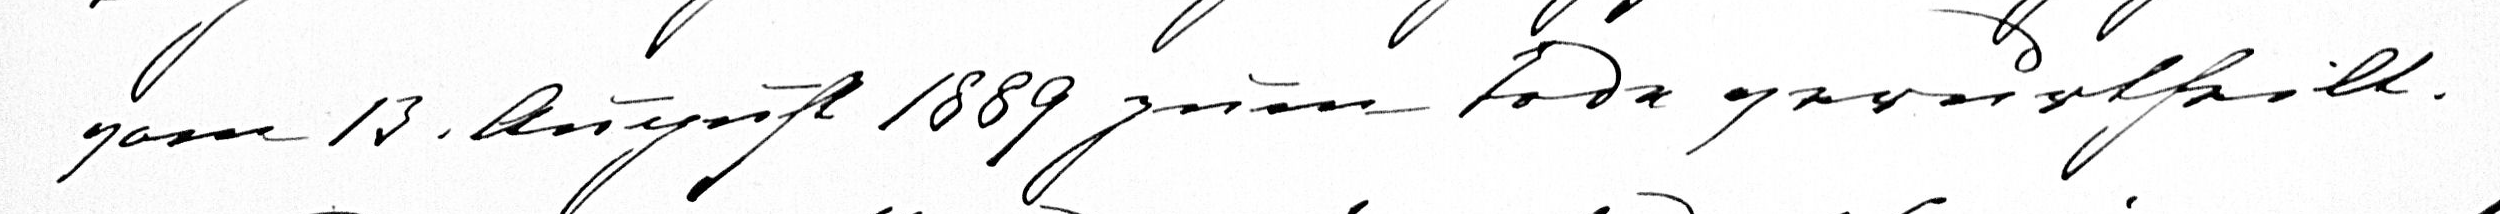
vom 13. August 1889 zum tode verurtheilt.
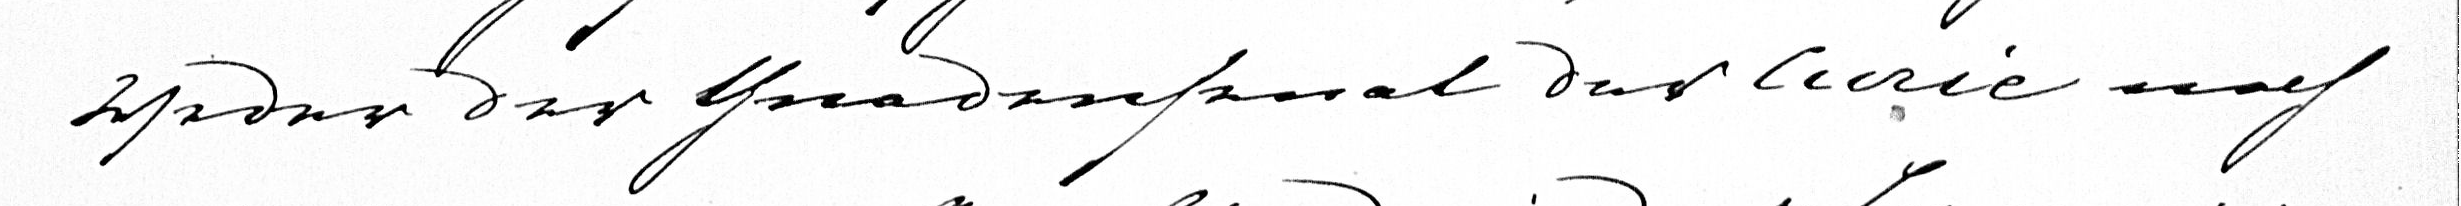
Weder der Gnadensenat der Curic noch
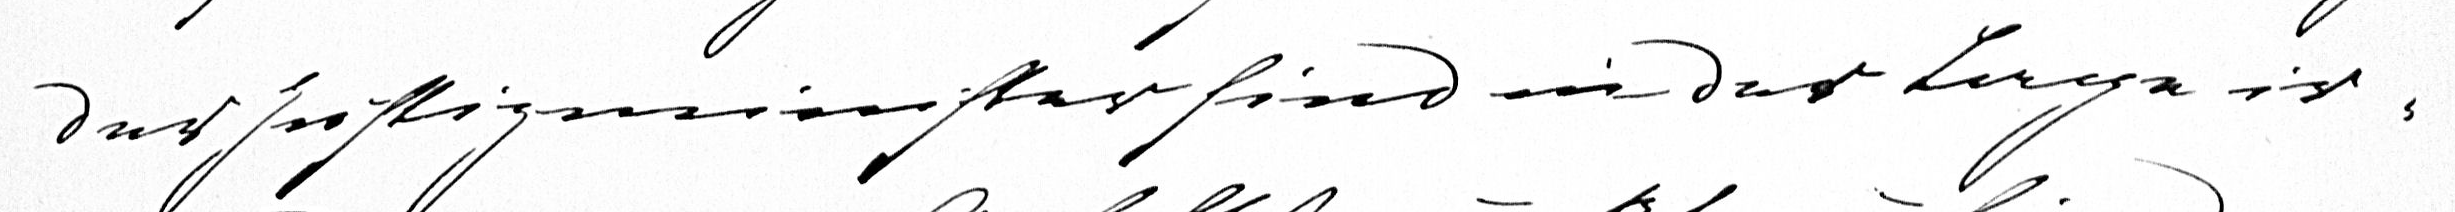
der Justizminister sind in der Lage ir¬
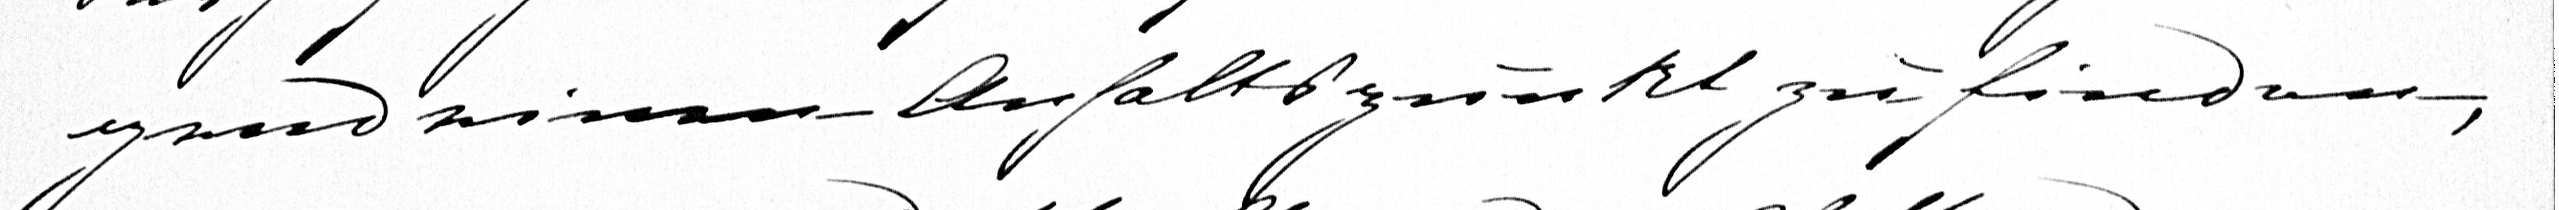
gend einen Anhaltspunkt zu finden,
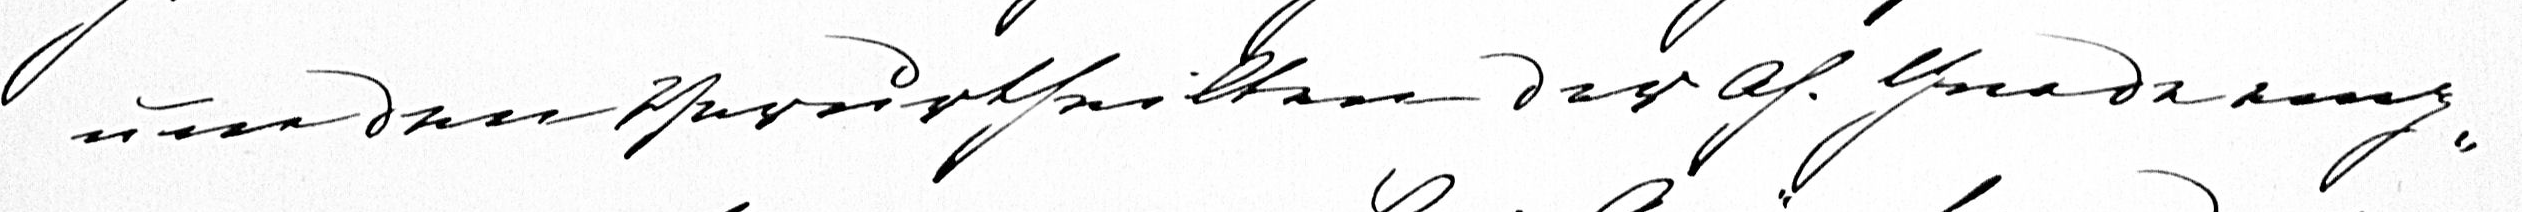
um den Verurtheilten der Ah. Gnade emp¬
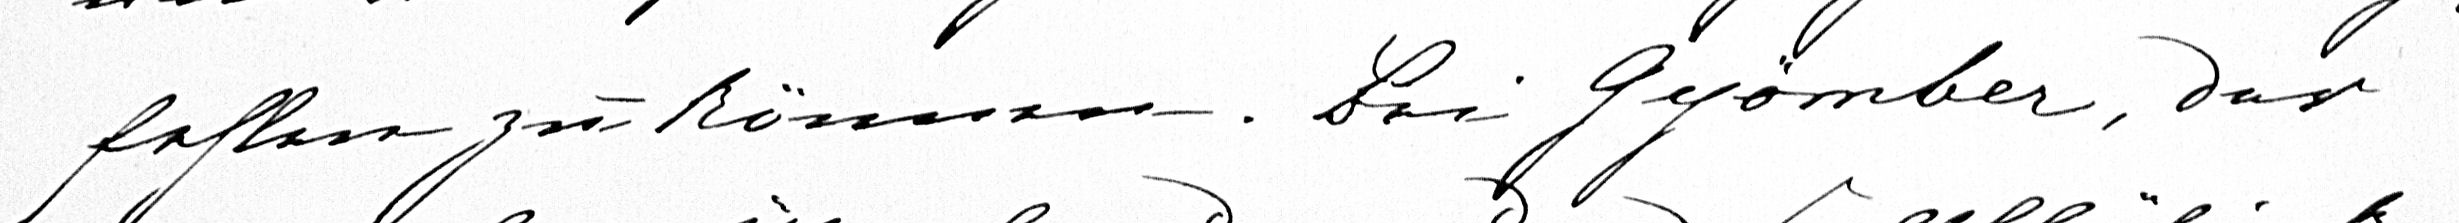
fehlen zu können. Bei Gyömber, der
